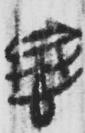惓（患）
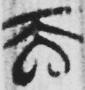而
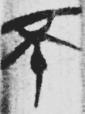不
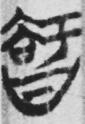智（知）
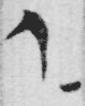人
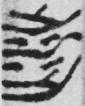涉
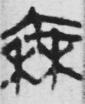秦（溱）
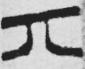亓（其）
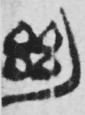絕
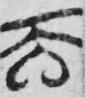而
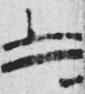士
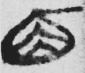角
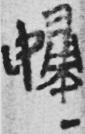婦
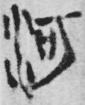河
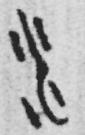水
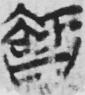智（知）
